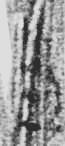内
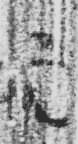亓（其）
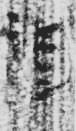眚（性）
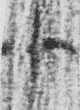一
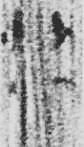也
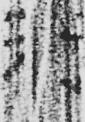亓（其）
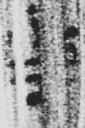甬（用）
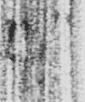心
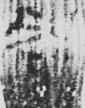各
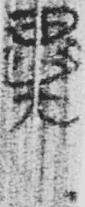異
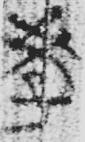○（教）
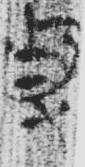史（使）
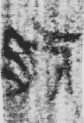肰（然）
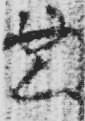也
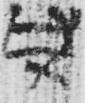凡
